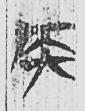侯
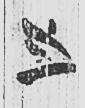之
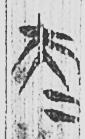夫=
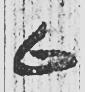㠯（以）
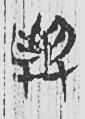與
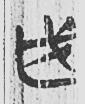戉
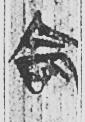命
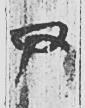尹
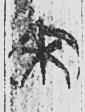宋
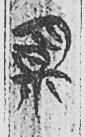{明示}
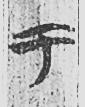于
